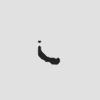亓（其）
